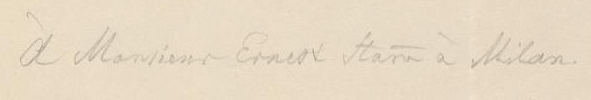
À Monsieur Ernest Stamm à Milan.
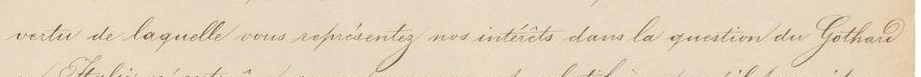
vertu de laquelle vous représentez nos intérêts dans la question du Gothard
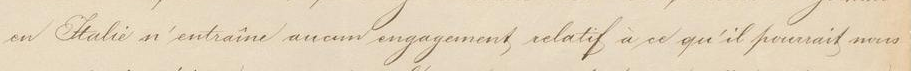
en Italie n'entraîne aucun engagement relatif à ce qu'il pourrait nous
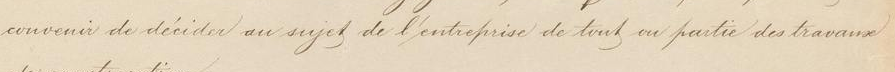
convenir de décider au sujet de l'entreprise de tout ou partie des travaux
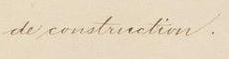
de construction.
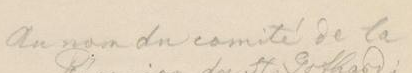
Au nom du comité de la
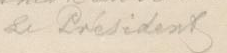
Le Président
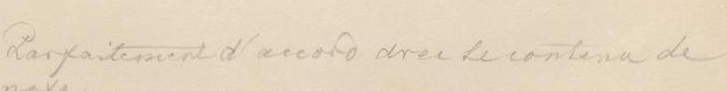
Parfaitement d'accord avec Le contenu de
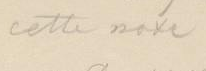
cette note
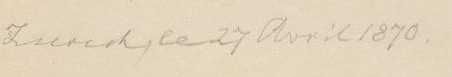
Zurich, le 27 Avril 1870.
